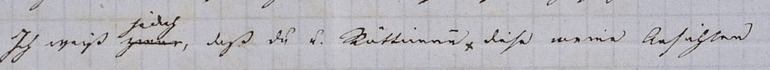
Ich weiß zwarjedoch, daß Du u. Rüttimann diese meine Ansichten
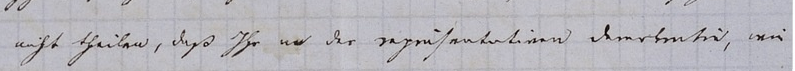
nicht theilen, daß Ihr an der repräsentativen Demokratie, wie
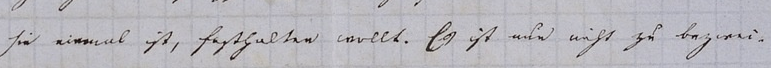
sie einmal ist, festhalten wollt . Es ist nun nicht zu bezwei-
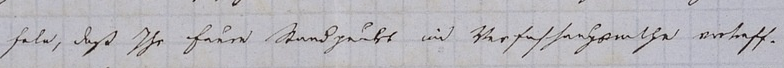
feln, daß Ihr Euern Standpunkt im Verfassungsrathe vortreff-
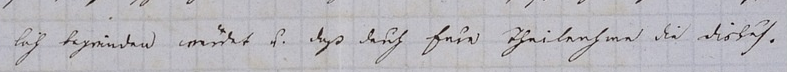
lich begründen würdet u. daß durch Eure Theilnahme die Diskus-
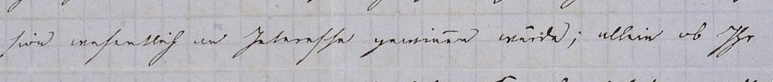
sion wesentlich an Interesse gewinnen würde; allein ob Ihr
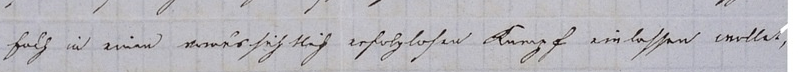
Euch in einen voraussichtlich erfolglosen Kampf einlassen wollet,
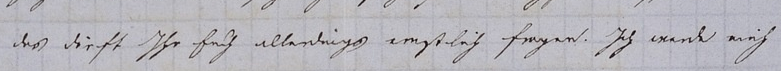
das dürft Ihr Euch allerdings ernstlich fragen. Ich werde mich
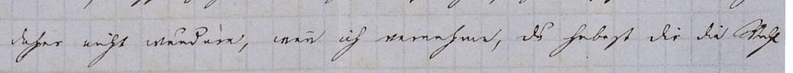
daher nicht wundern, wenn ich vernehme, Du habest Dir die Sache
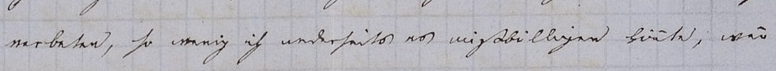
verbeten, so wenig ich anderseits es mißbilligen könnte, wenn
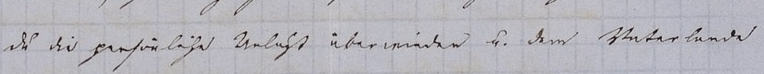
Du die persönliche Unlust überwinden u. dem Vaterlande
